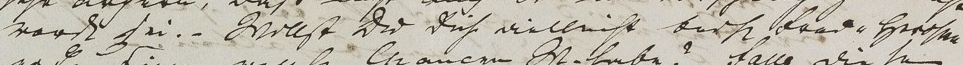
worden sei. – Willst Du Dich vielleicht bei Herrn Frei-Herosee
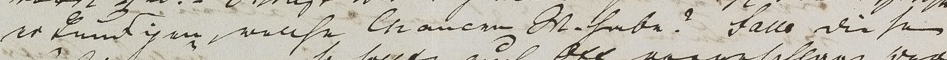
erkundigen welche Chancen W. habe? Falls diese
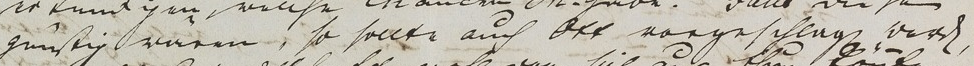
günstig wären, so sollte auch Ott vorgeschlagen werden,
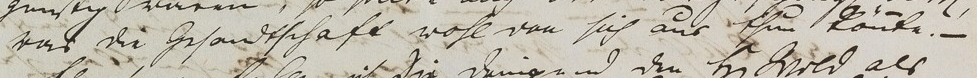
was die Gesandtschaft wohl von sich aus thun könnte. –
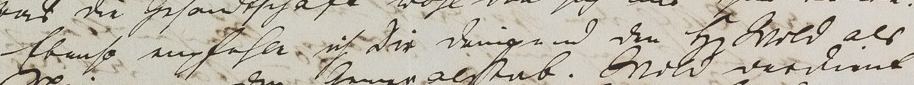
Ebenso empfehle ich Dir dringend den Herrn Wild als
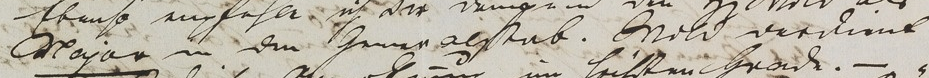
Major in den Generalstab. Wild verdient
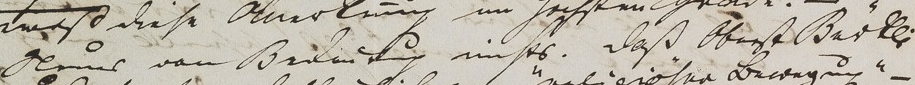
Neues von Bedeutung nichts. Daß Oberst Bürkli
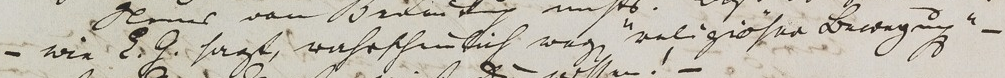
– wie E. G. sagt, wahrscheinlich wegen «religiöser Bewegungen» –
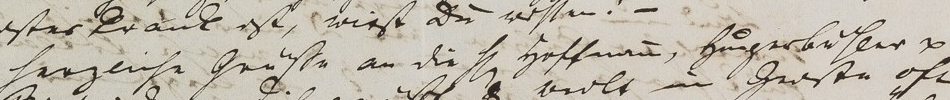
Herzliche Grüße an die Herren Hoffmann, Hungerbühler &
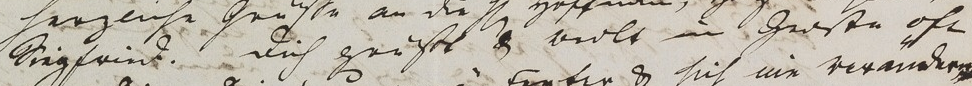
Siegfried. Dich grüßt & weilt im Geiste oft
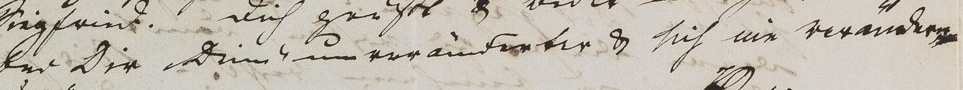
bei Dir Dein «unveränderter & sich nie verändern-
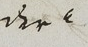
der»
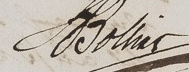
Bollier
